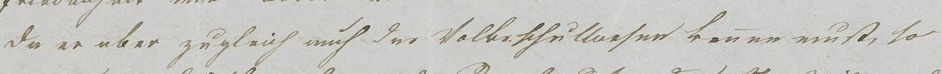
Da er aber zugleich auch das Voksschulwesen kennen muß, so
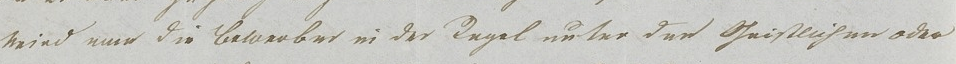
wird man die Bewerber in der Regel unter den Geistlichen oder
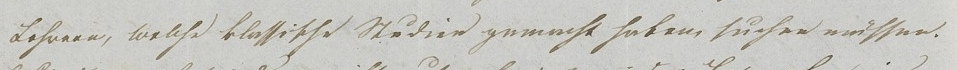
Lehrern, welche klassische Studien gemacht haben, suchen müssen.
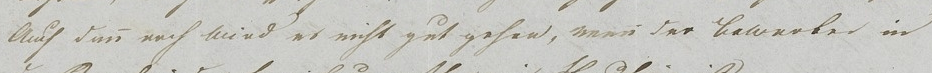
Auch dann noch wird es nicht gut gehen, wenn der Bewerber in
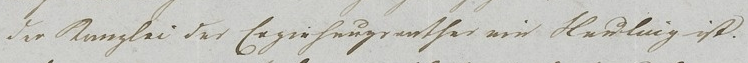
der Kanzlei des Erziehungsrathes ein Neuling ist.
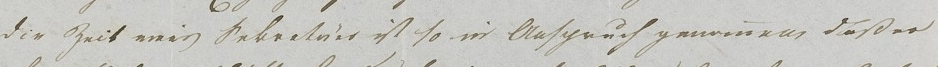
Die Zeit eines Sekretärs ist so in Anspruch genommen, daß er
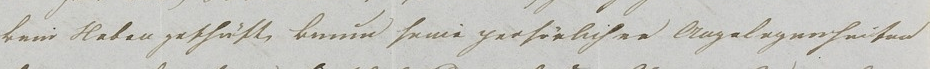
kein Nebengeschäft, kaum seine persönlichen Angelegenheiten
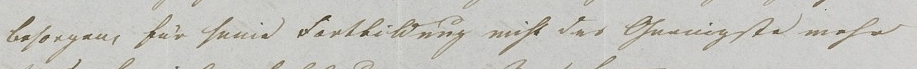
besorgen, für seine Fortbildung nicht das Geringste mehr
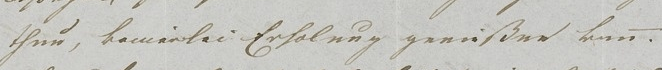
thun, keinerlei Erholung genießen kann.
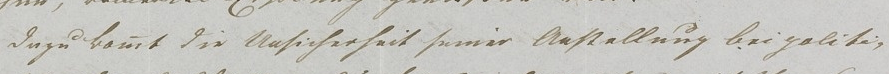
Dazu kommt die Unsicherheit seiner Anstellung bei politi-
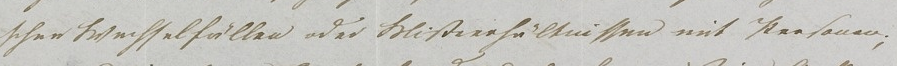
schen Wechselfällen oder Mißverhältnissen mit Personen;
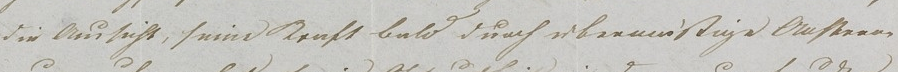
die Aussicht, seine Kraft bald durch übermäßige Anstren-
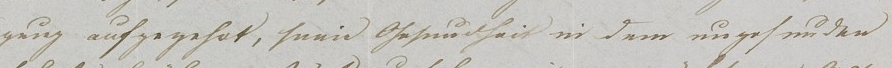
gung aufgezehrt, seine Gesundheit in dem ungesunden
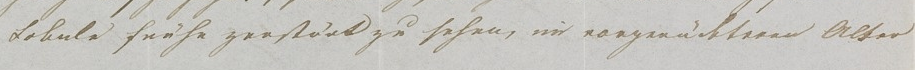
Lokale frühe zerstört zu haben, im vorgenrückteren Alter
